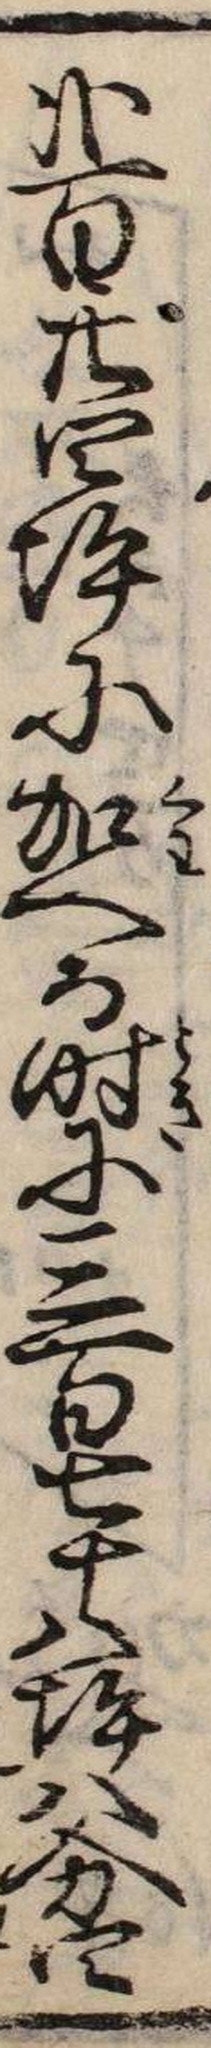弐百廿四坪に加へる時に三百七十八坪八分四
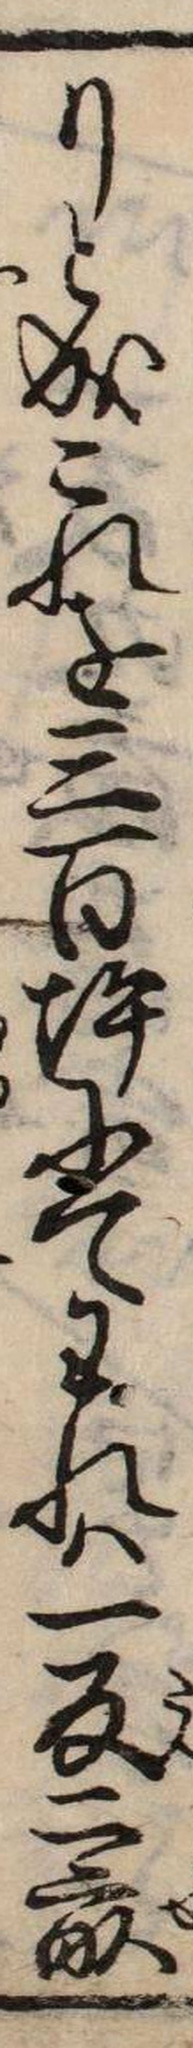りと成これを三百坪にてわれは一反二畝
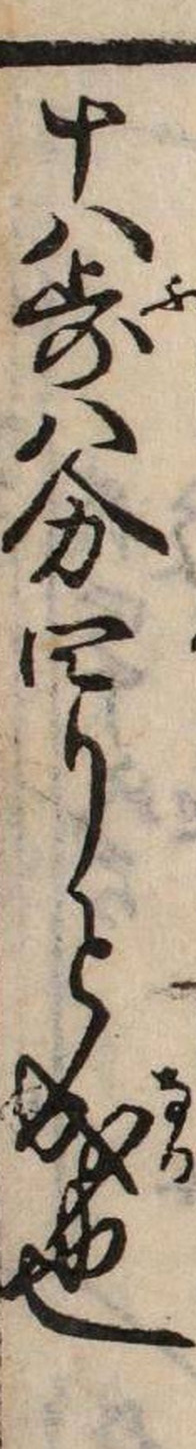十八歩八分四りと成也

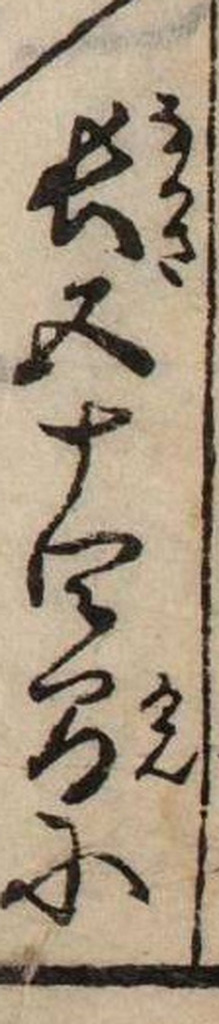長五十四間に
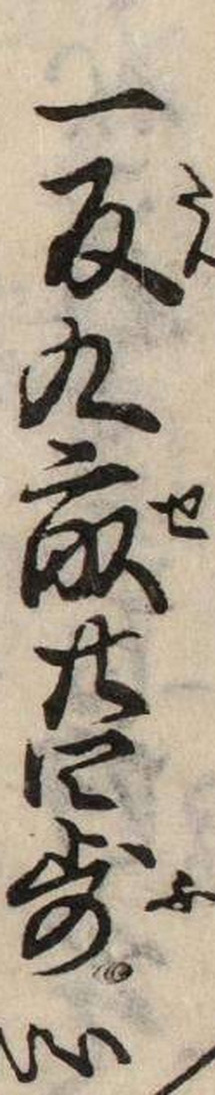一反九畝廿四歩
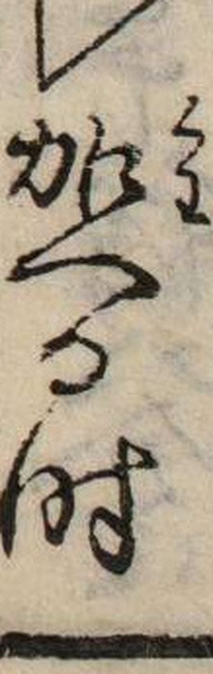加へる時
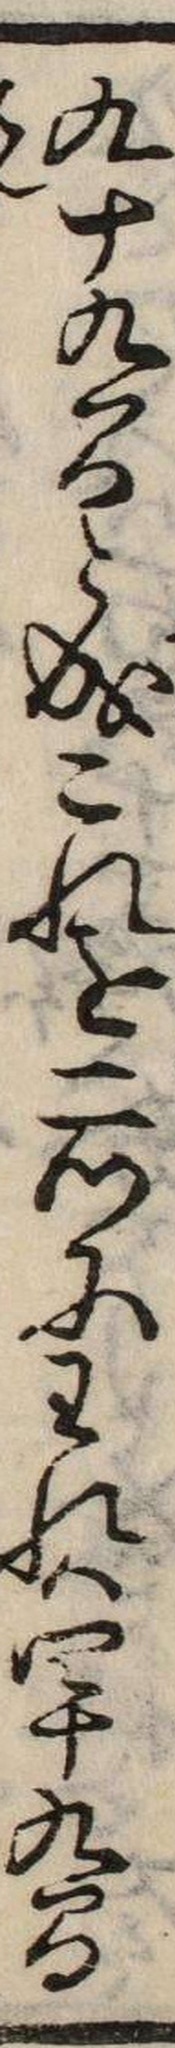九十九間と成これを二つにわれは四十九間
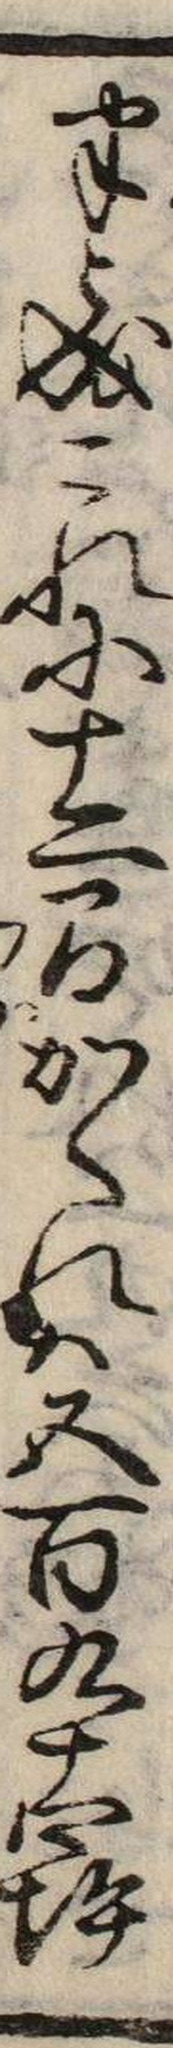半と成これに十二間かくれは五百九十四坪
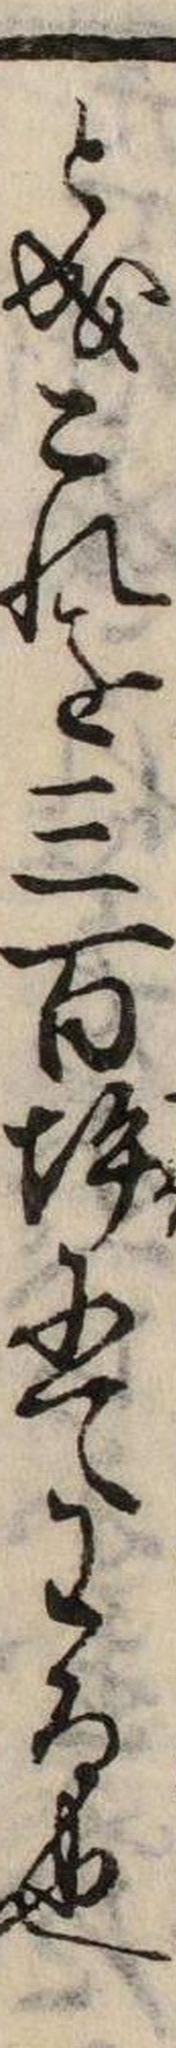と成これを三百坪にてわる也
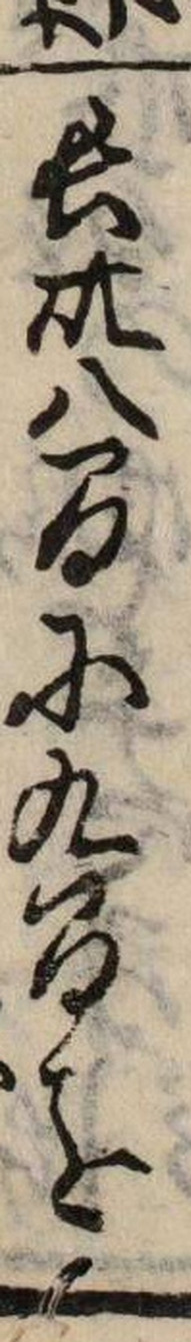長卅八間に九間を
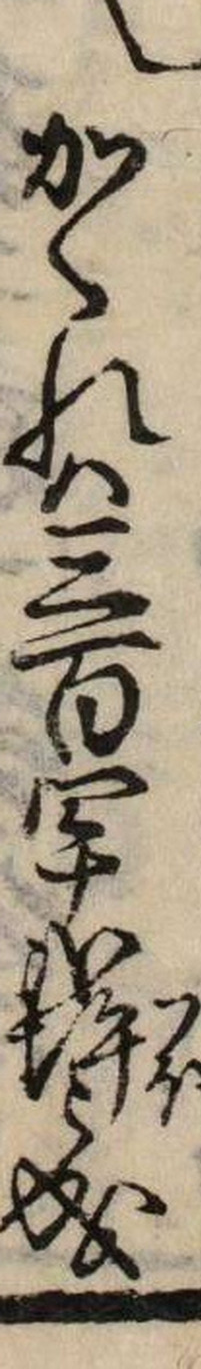かくれは三百四十弐坪と成
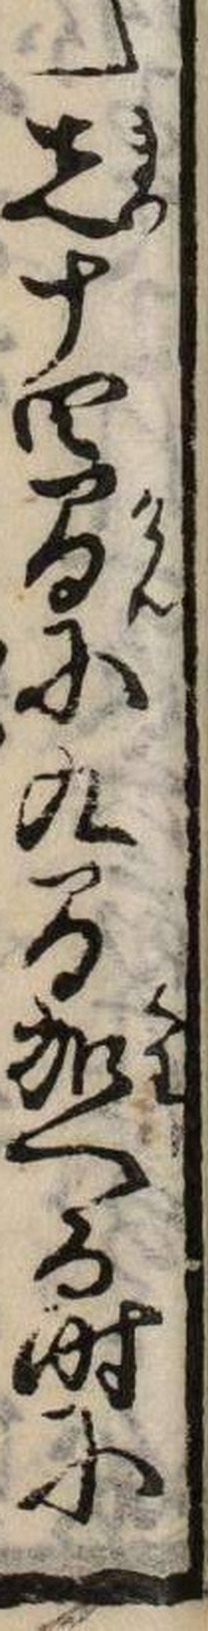先十四間に九間加へる時に
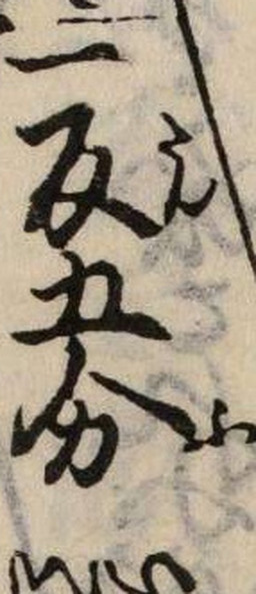一反五分
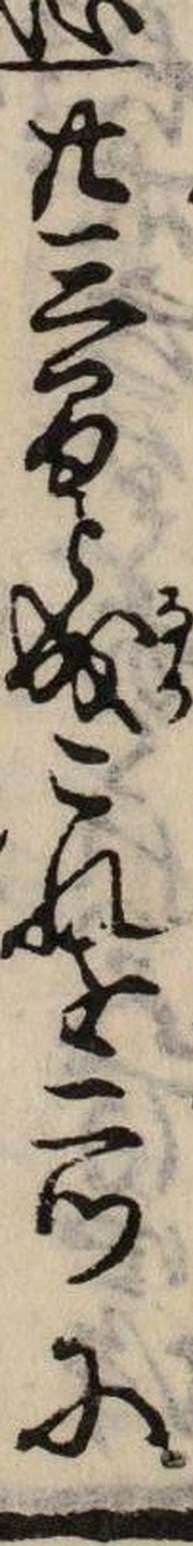廿三間と成これを二ツに
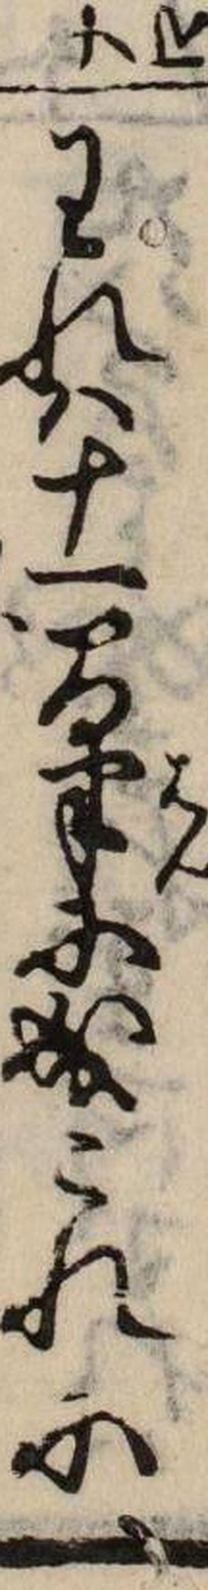われは十一間半に成これに
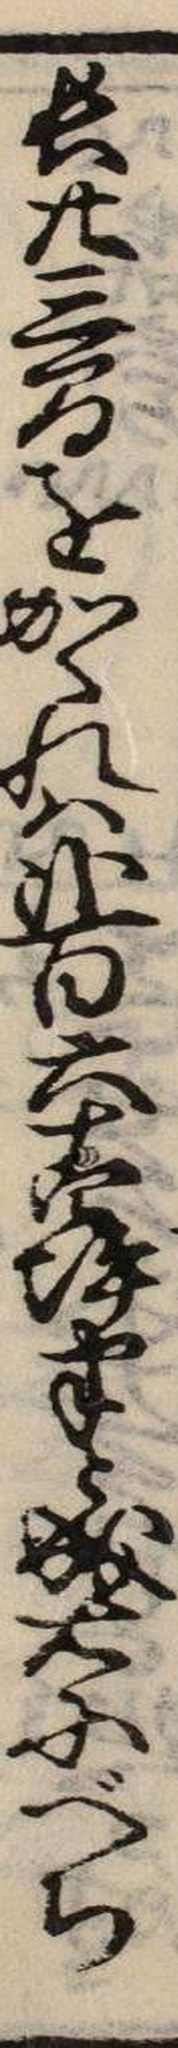長廿三間をかくれは弐百六十四坪半と成右にべち
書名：塵劫記（寛永11年自跋、京都府立京都学・歴彩館追貴8）
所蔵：京都府立京都学・歴彩館 国文学研究資料館
